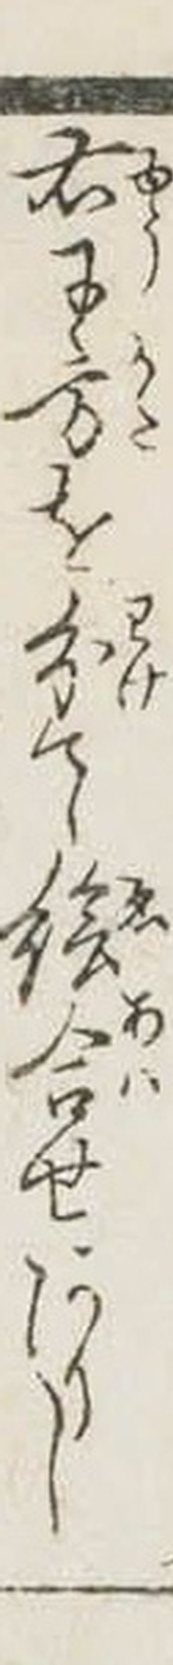右に方を分て絵合せありし
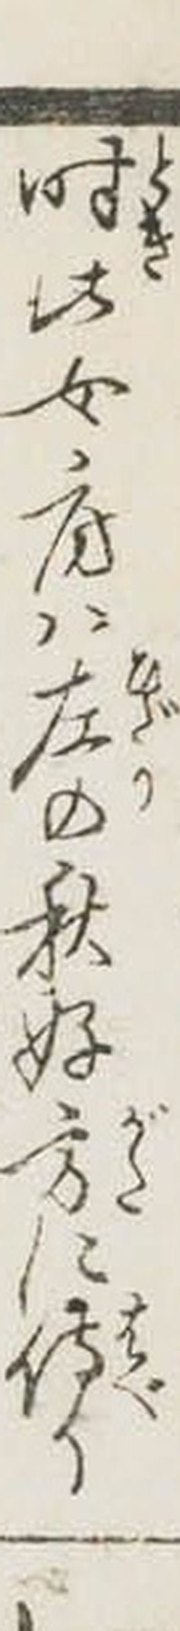時此女房は左の秋好方に侍り
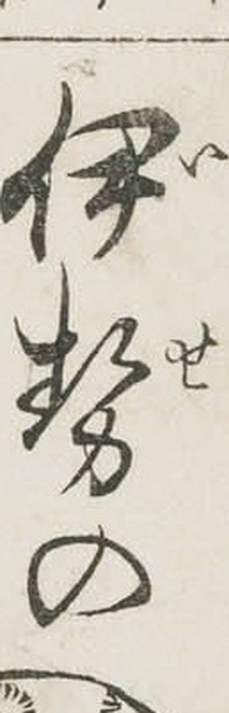伊勢の
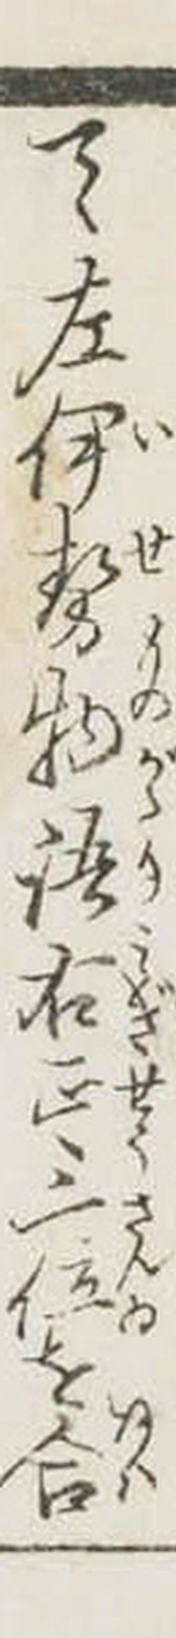て左伊勢物語右正三位を合
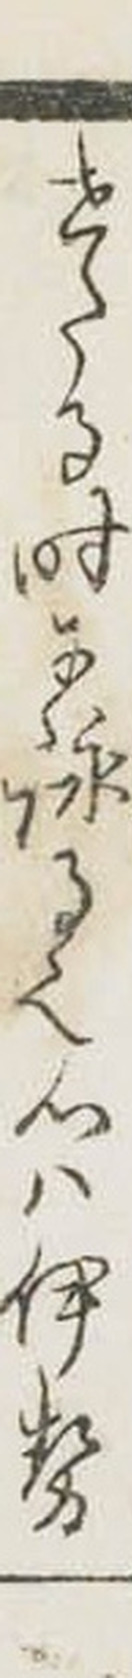せたる時に詠る也心は伊勢
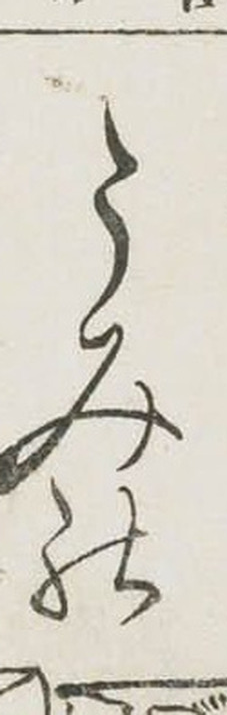うみの
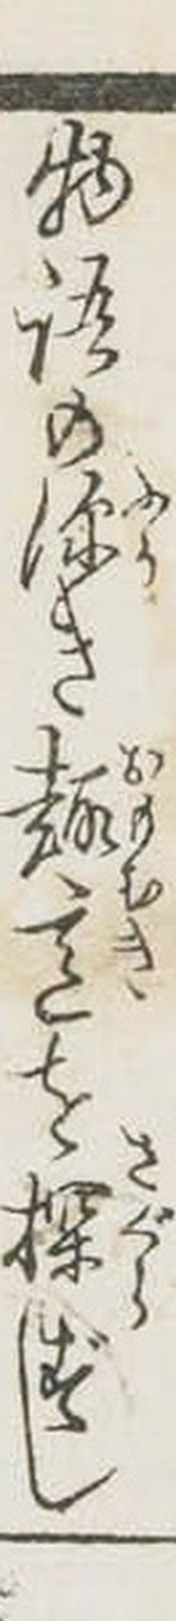物語の深き趣を探ずし
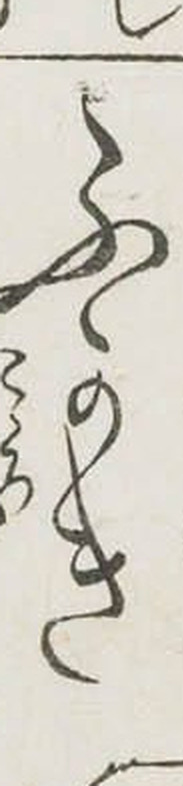ふかき
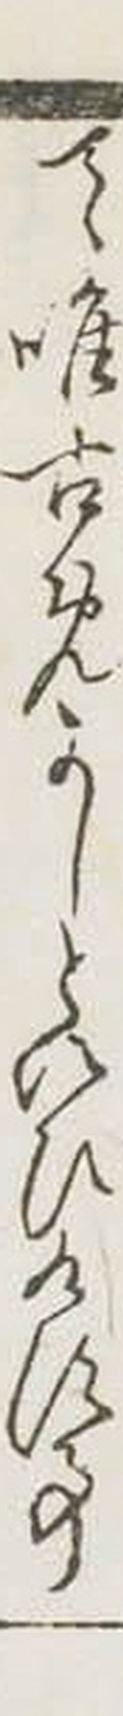て唯古めかしといひけす事
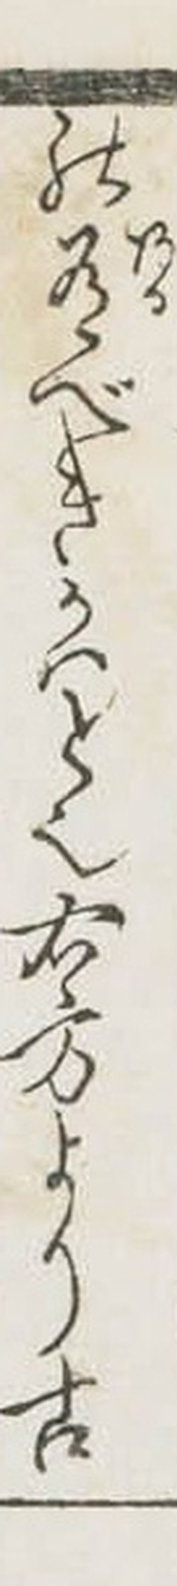の有べきかはと也右方より古
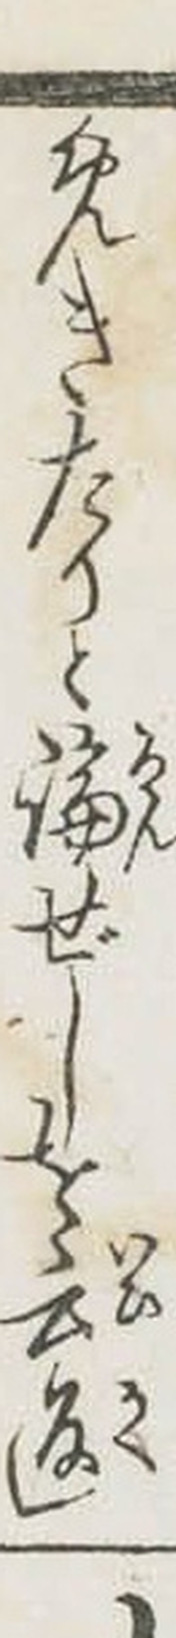めきたりと論ぜしを云返
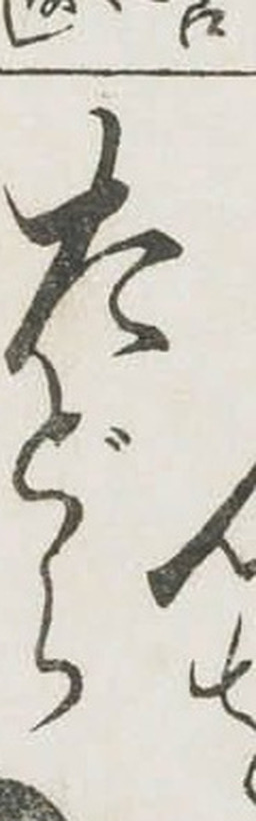たどら
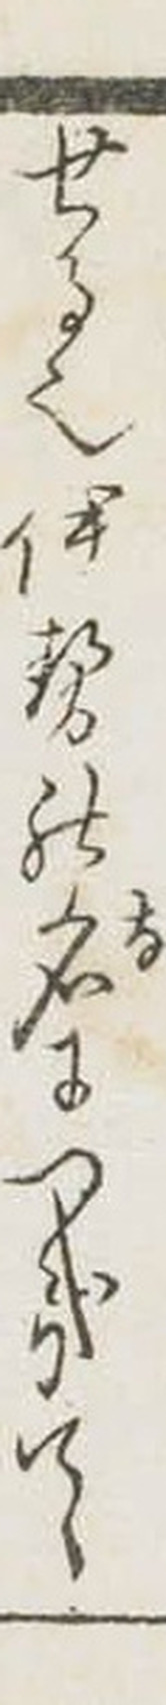せる也伊勢の名につけて
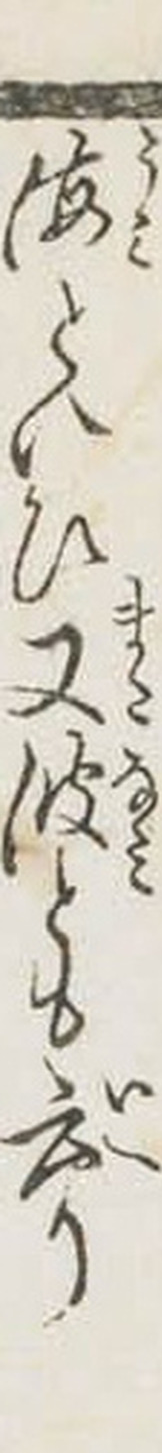海といひ又波とも云り
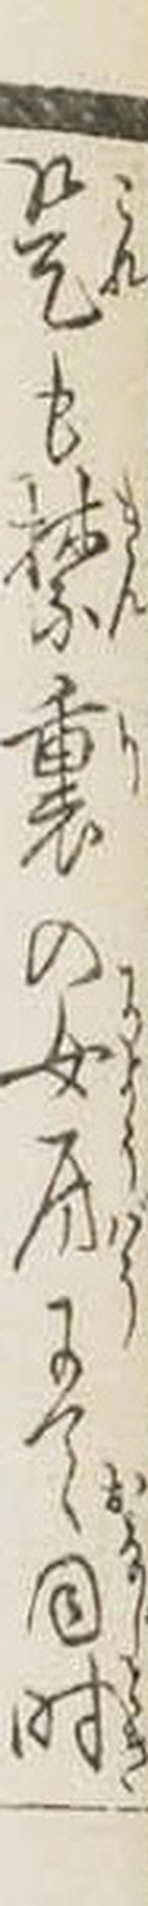是も禁裏の女房にて同時
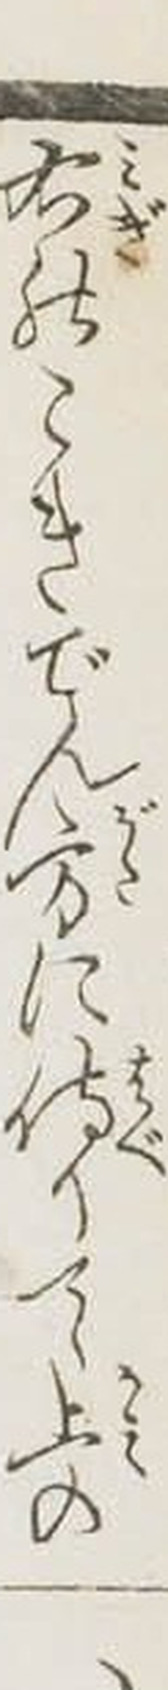右のこきでん方に侍りて上の
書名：源氏百人一首
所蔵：東京学芸大学教育コンテンツアーカイブ
